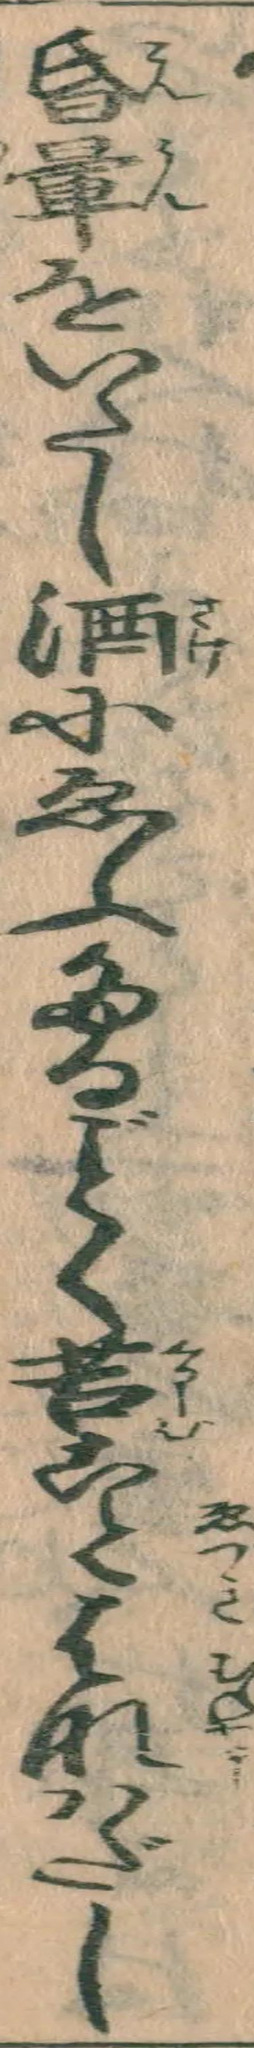昏暈をいたし酒にゑふたるごとく苦ことはなはだし
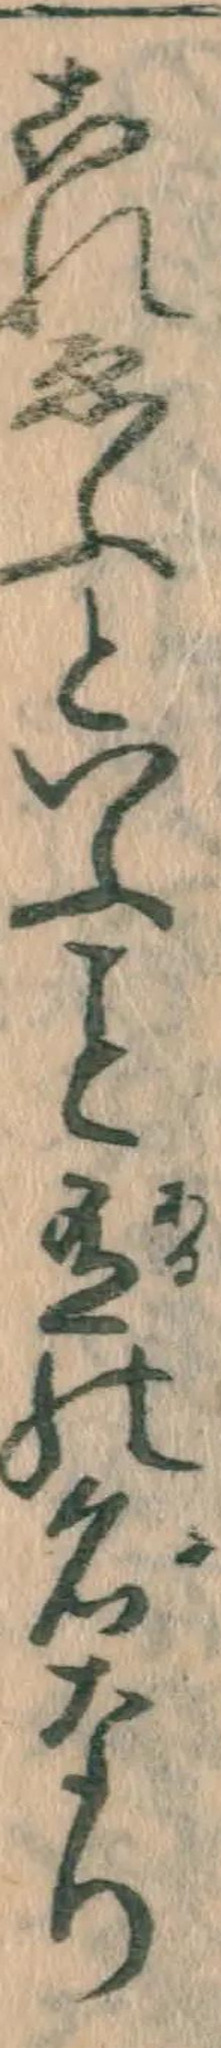これゑふといふこと有の名なり
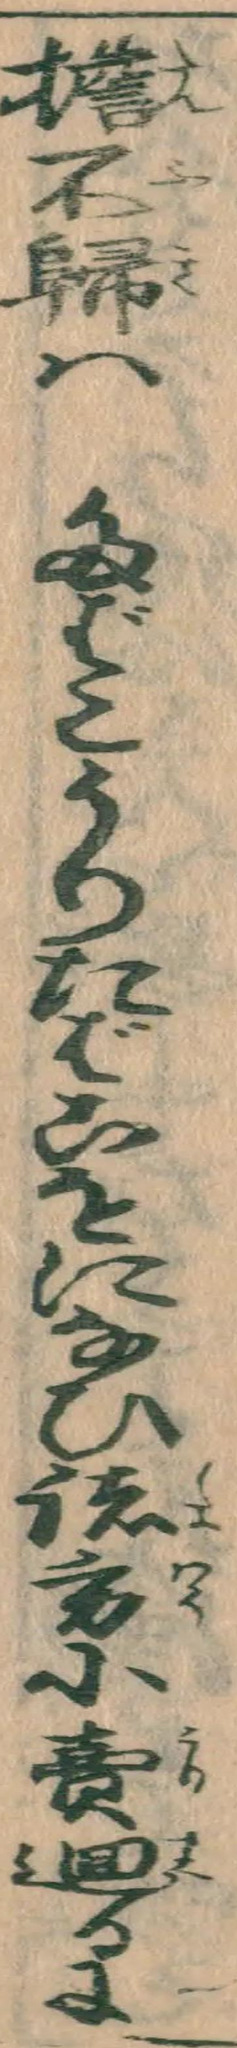但不帰はたばこうりたばこをになひ諸方に売廻るに
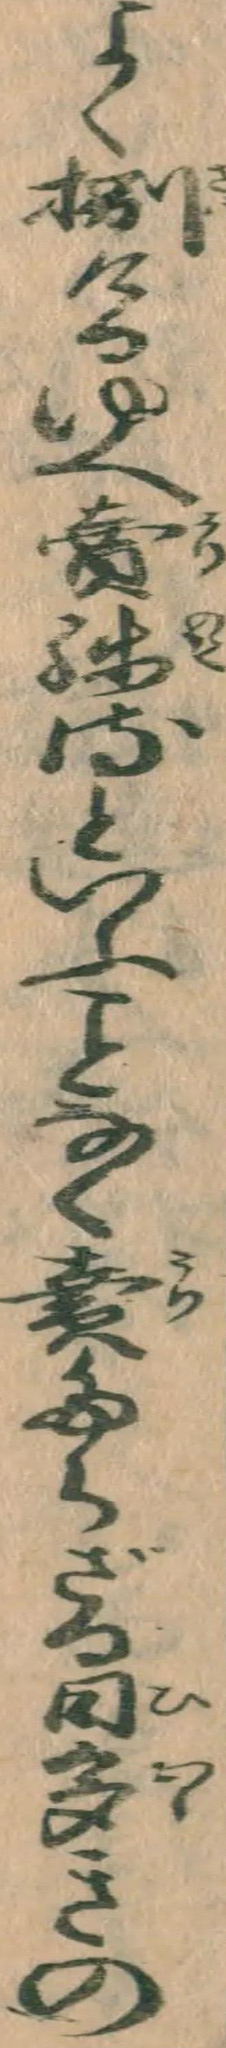よく捌けるゆへ売残るといふことなく売たらざる日多きの
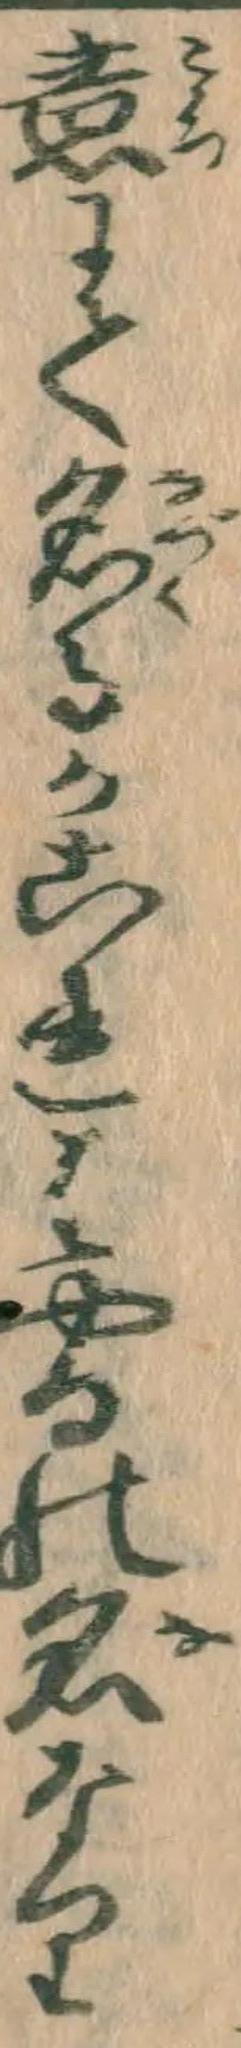意にて名るかこれはやるの名なり
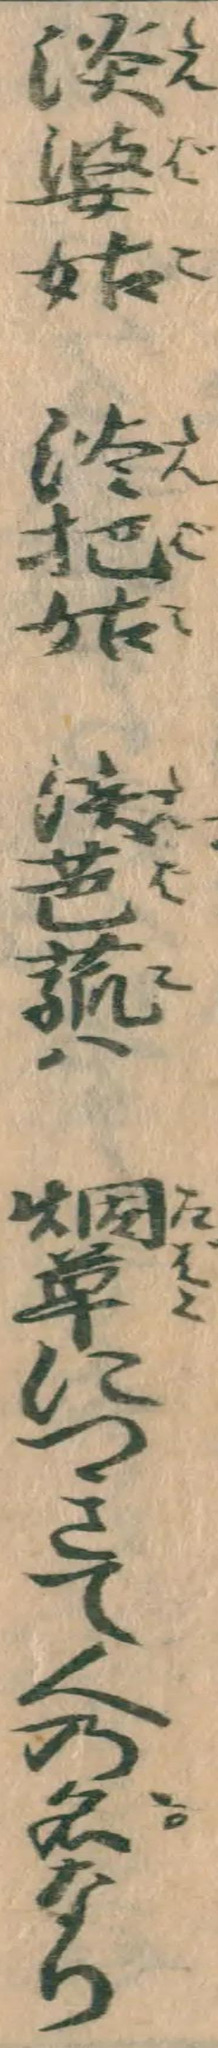淡婆姑淡把姑淡芭菰は烟草につきて人の名なり
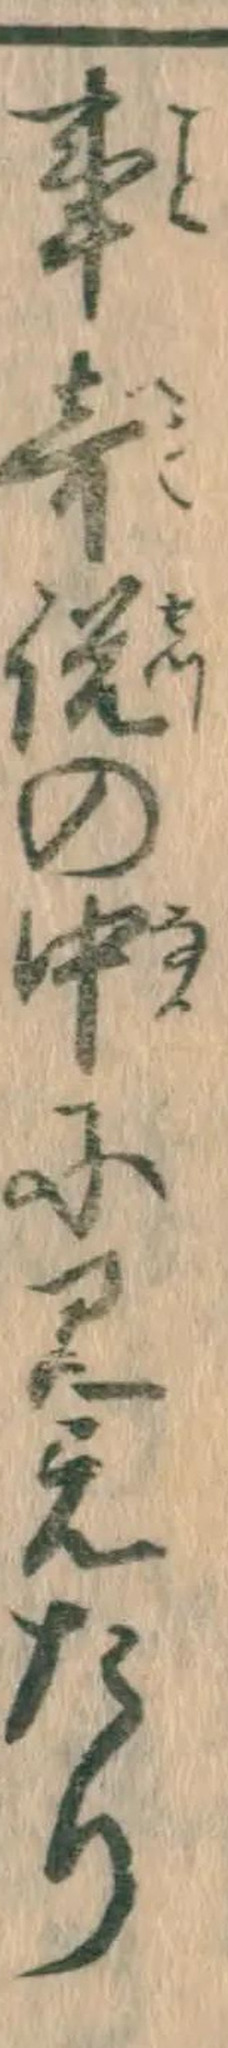事奇説の中に見えたり
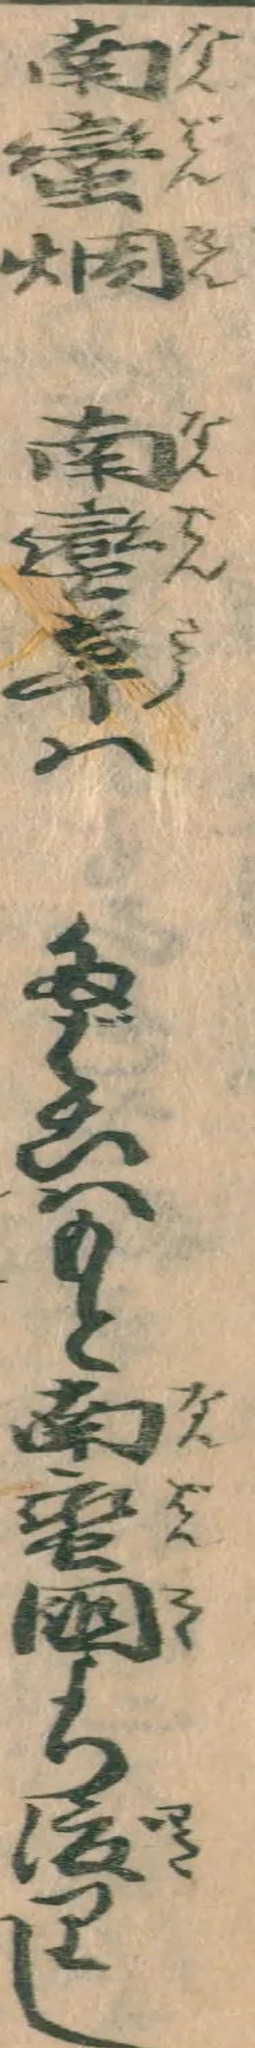南蛮烟南蛮草はたばこはもと南蛮国より渡りし
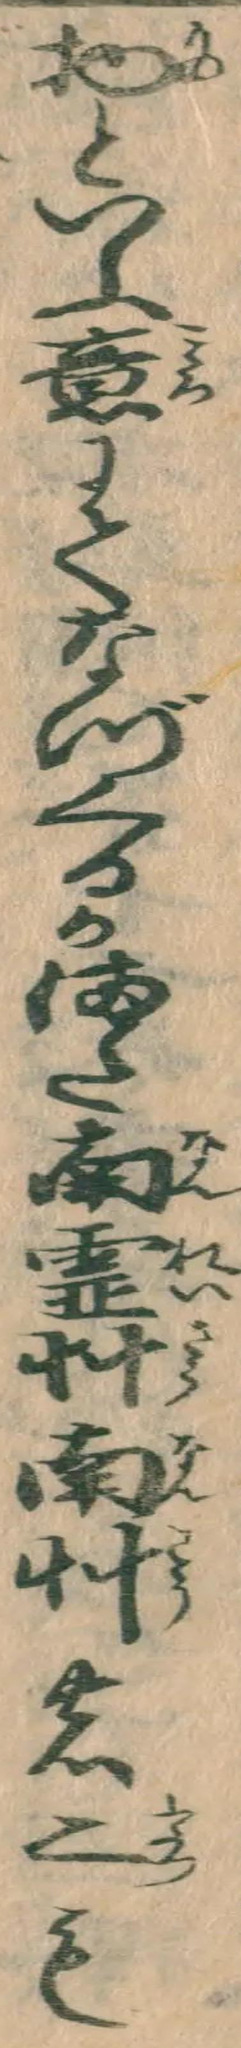物といふ意にてなづくるかまた南霊草南草の二も
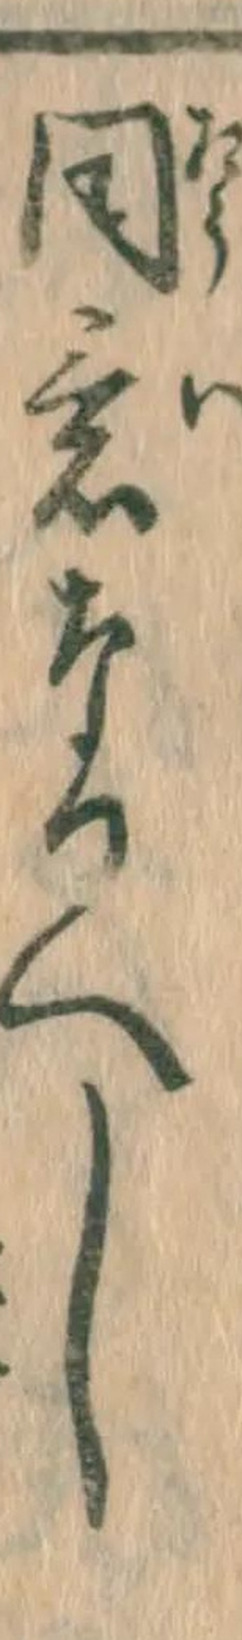同意なるへし
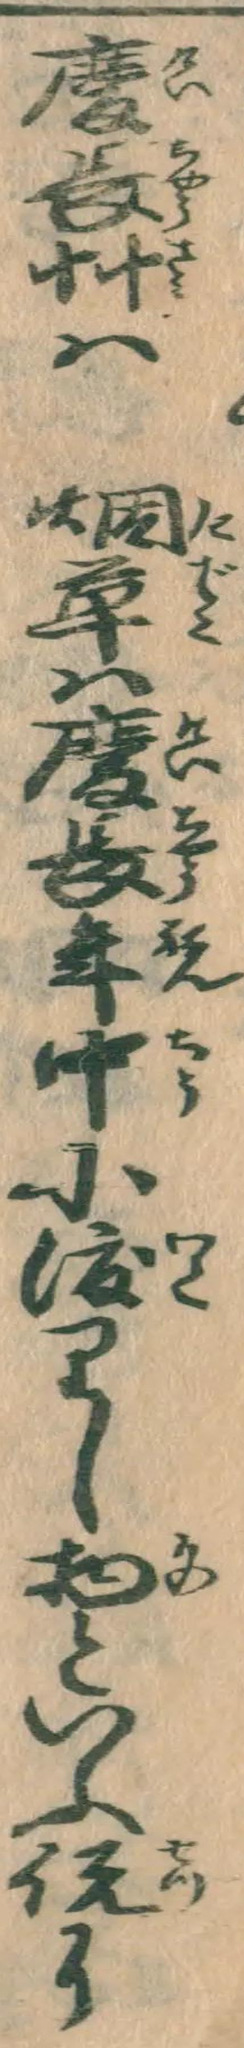慶長草は烟草は慶長年中に渡りし物といふ説に
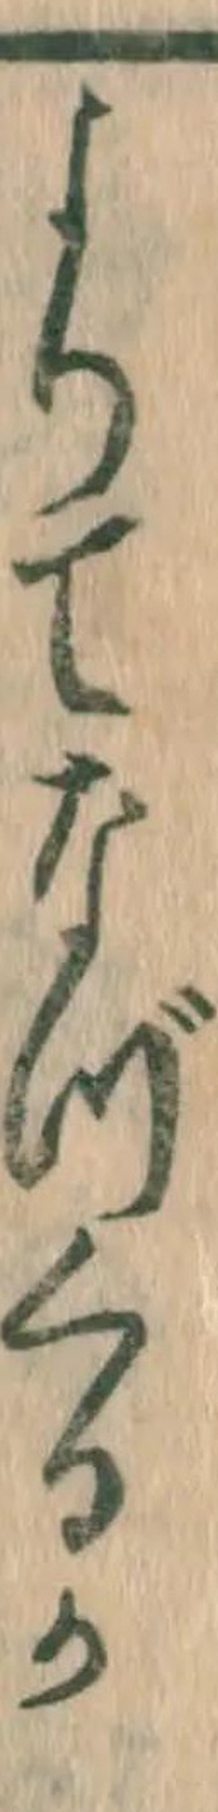よりてなづくるか
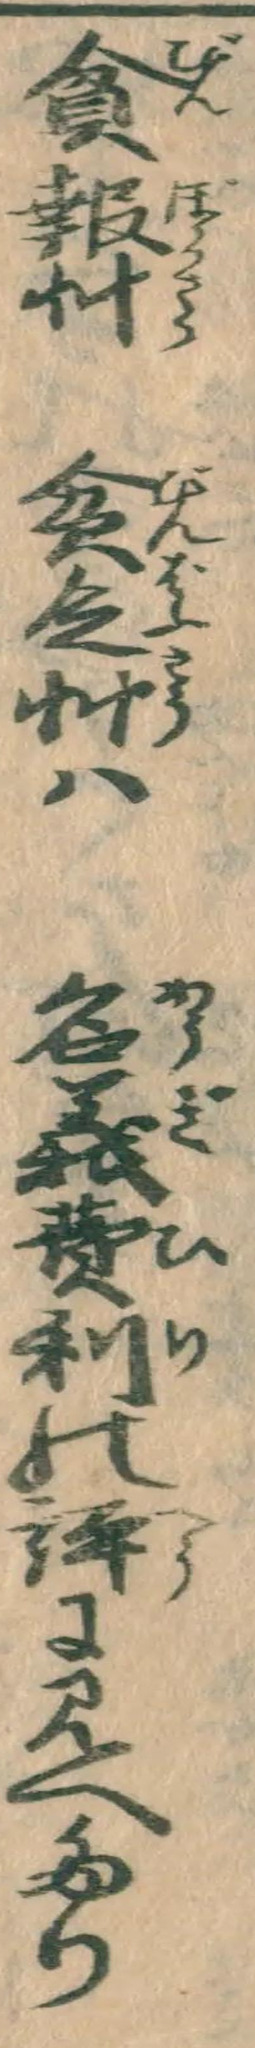貧報草貧乏草は名義費利の評に見へたり
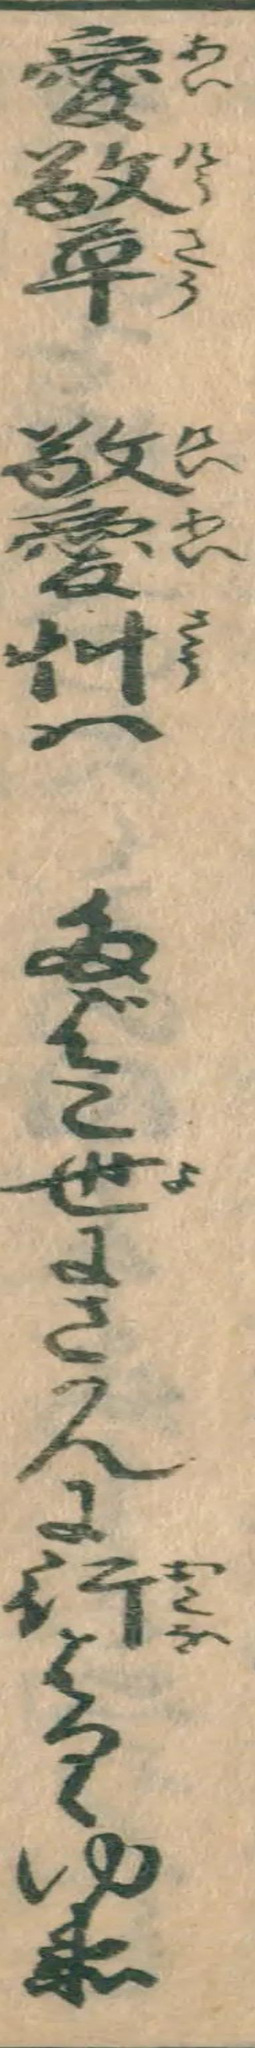愛敬草敬愛草はたばこ世にさかんに行はるゝゆゑ
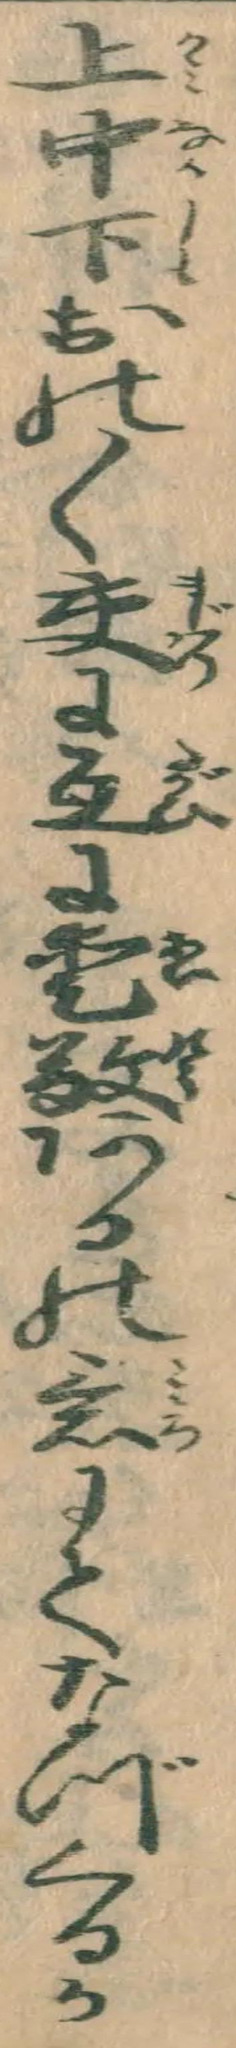上中下おの〳〵交に互に愛敬あるの意にてなづくるか
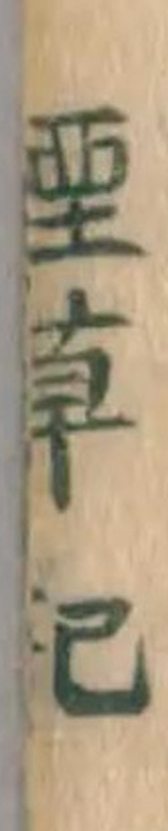煙草記
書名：煙草記
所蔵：国立国会図書館 National Diet Library, JAPAN
